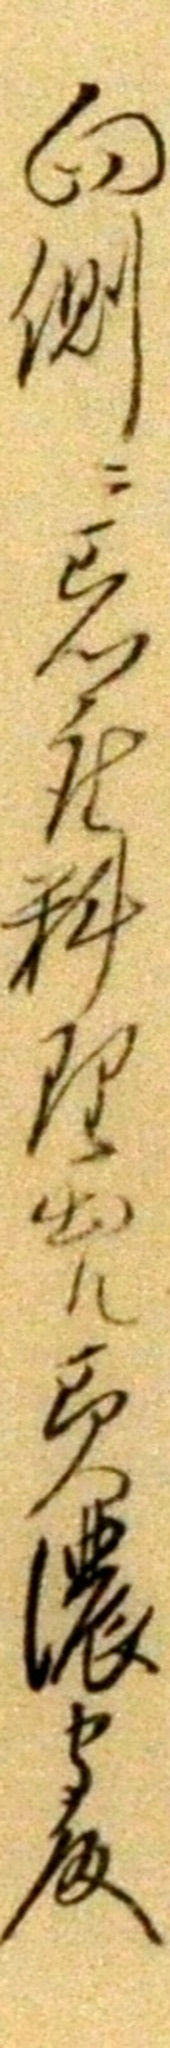向側二着座料理出ル美濃守殿
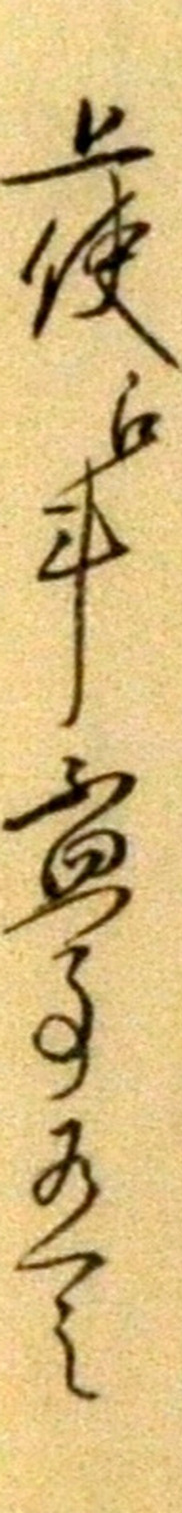上使え計盃事有之

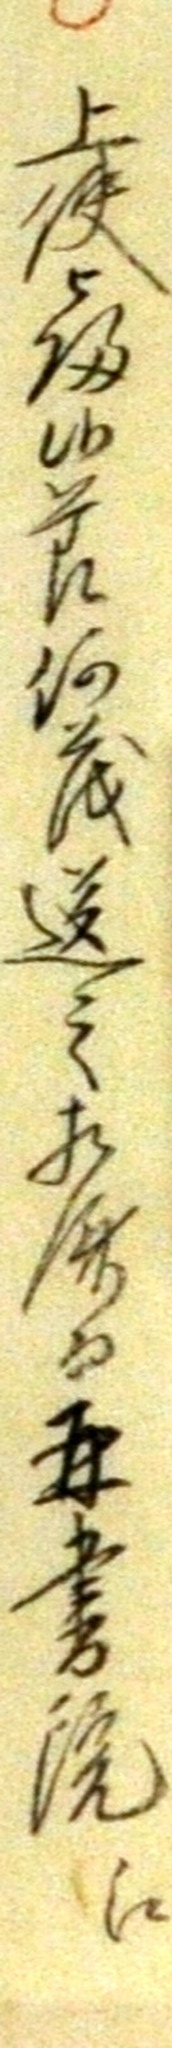上使被帰候節何も送之相済而再書院え
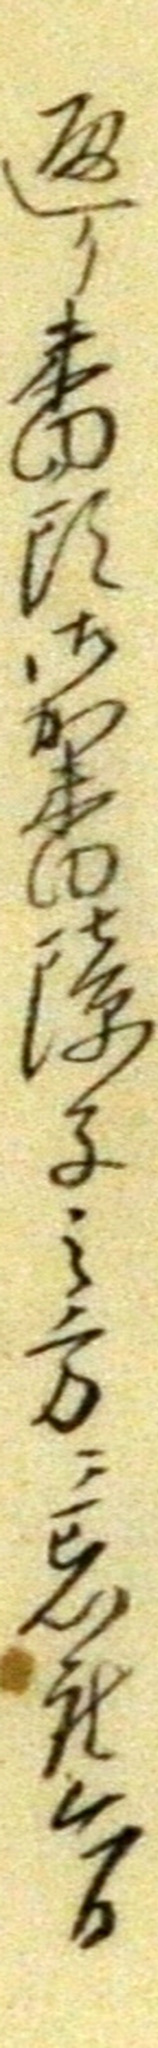通り番頭御加番障子之方二着座今日
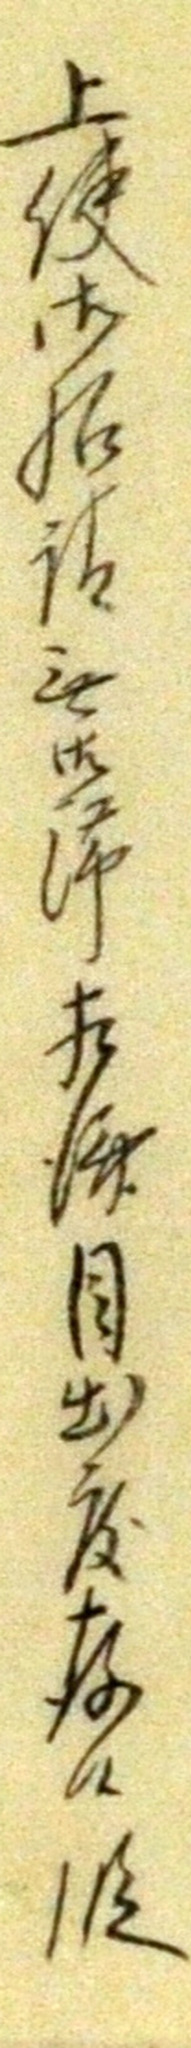上使御招請無御滞相済目出度存候段
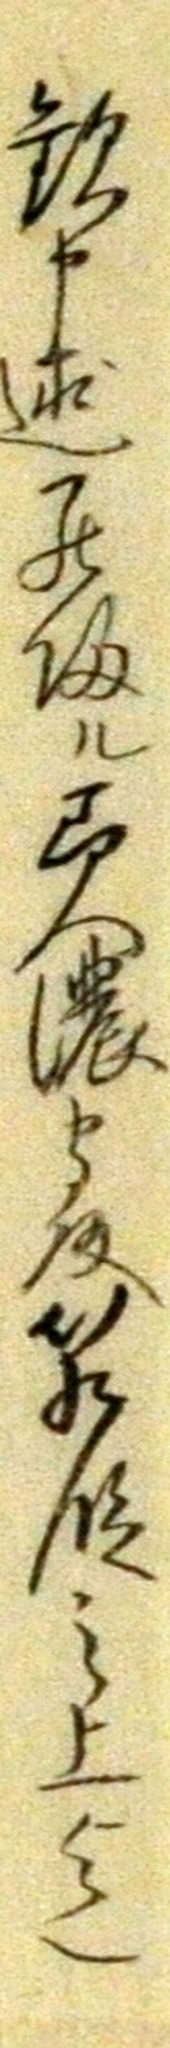歎申述罷帰ル美濃守殿箱段之上迄
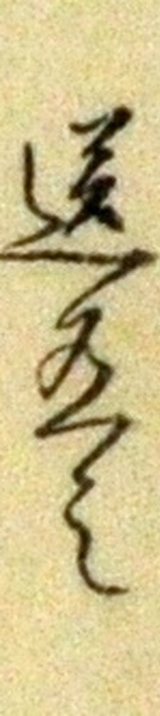送有之
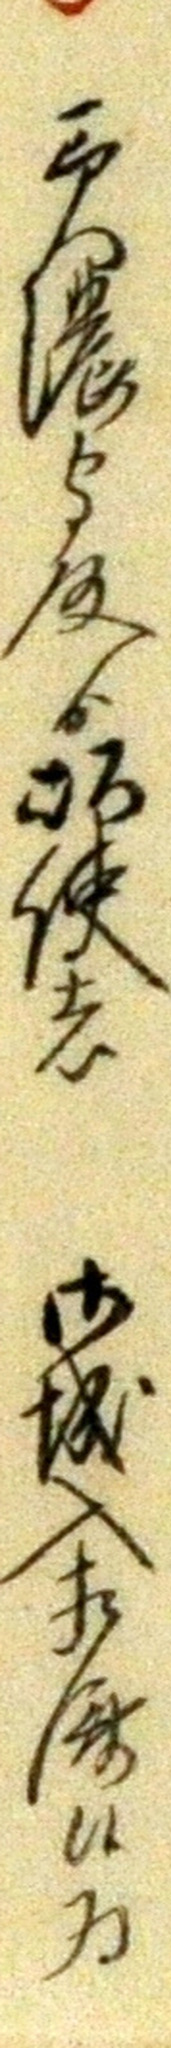美濃守殿ゟ以使者御城入相済候為
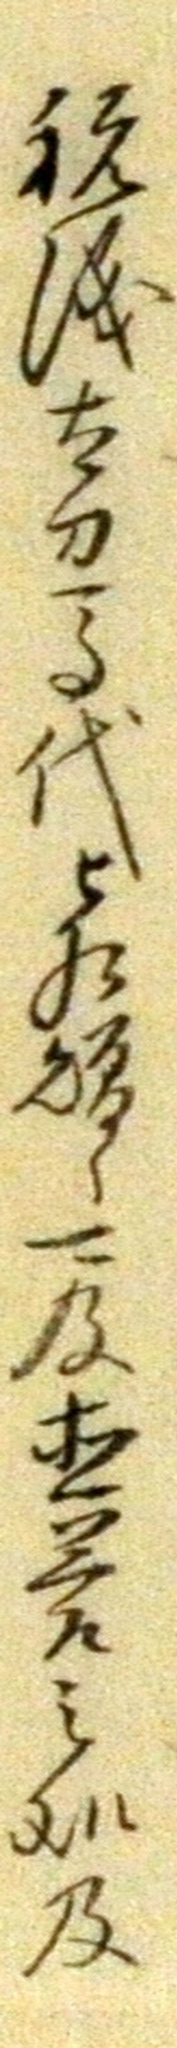祝儀太刀馬代被相贈候可及直答之処及
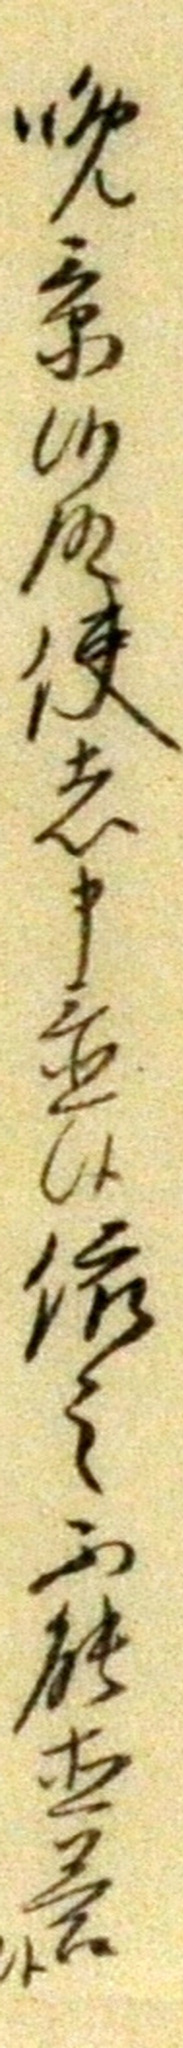晩参候故使者申置候依之不能直答候
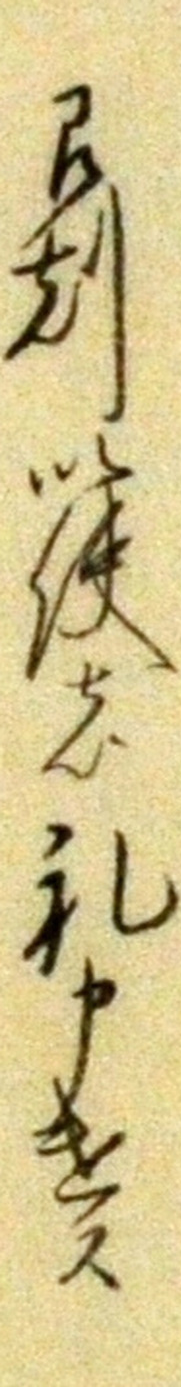即刻以使者礼申遣ス
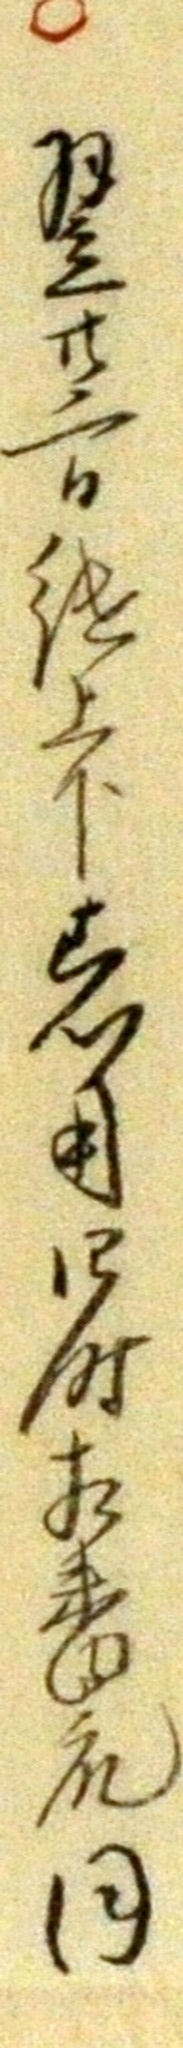翌廿二日継上下着用四時相番衆同
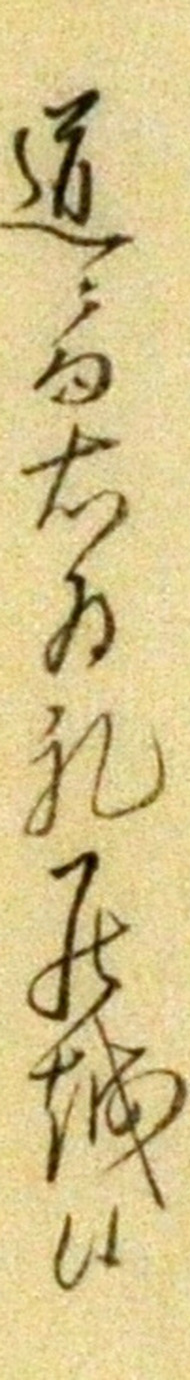道ニ而右為礼罷越候
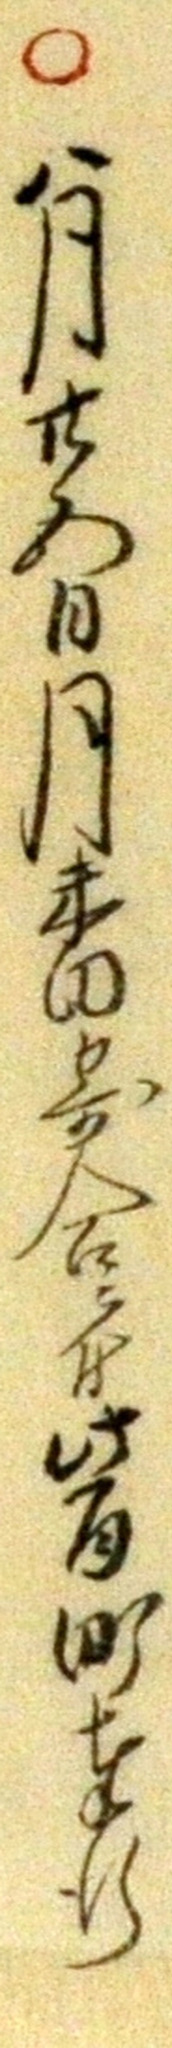八月廿五日月番寄合二付此間町奉行
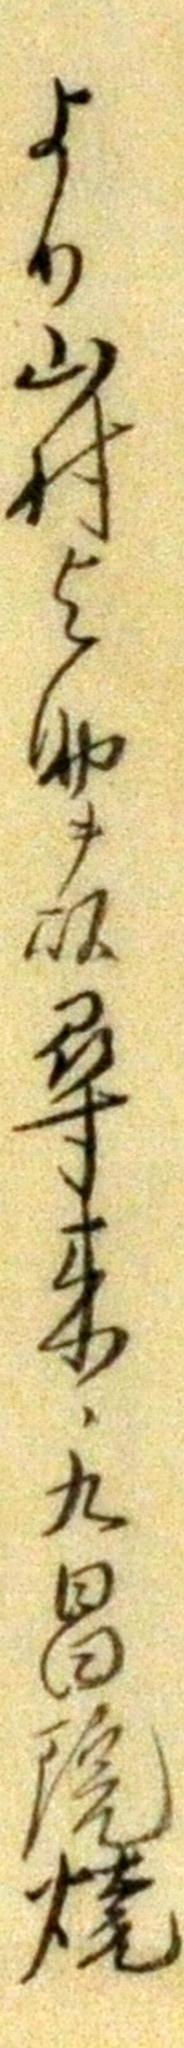より山村与助ヲ以尋来候九昌院焼
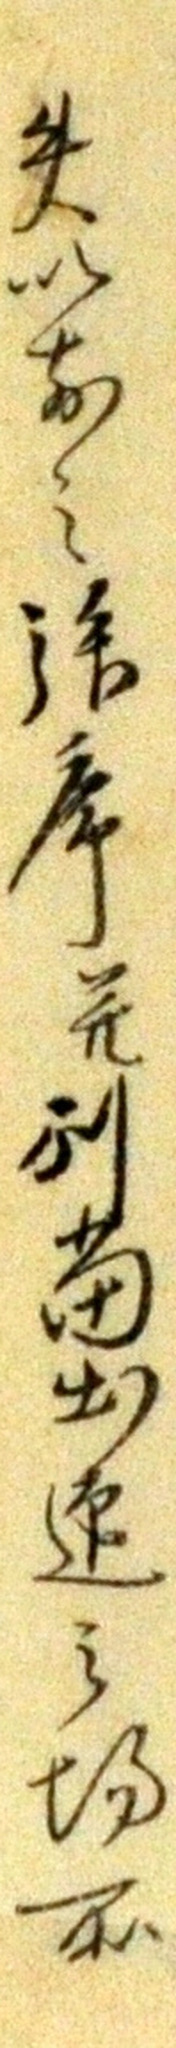失以前之拝席并別当出迎之場所
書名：大阪加番関係諸書留〔一括〕
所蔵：伊那市立高遠町図書館・合同会社AMANE
